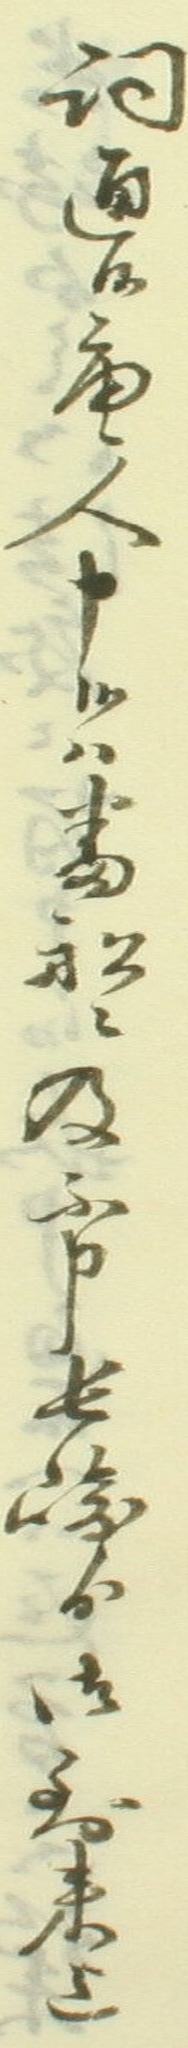詞通候唐人申候は番船に及不申長崎ゟ御到来迄
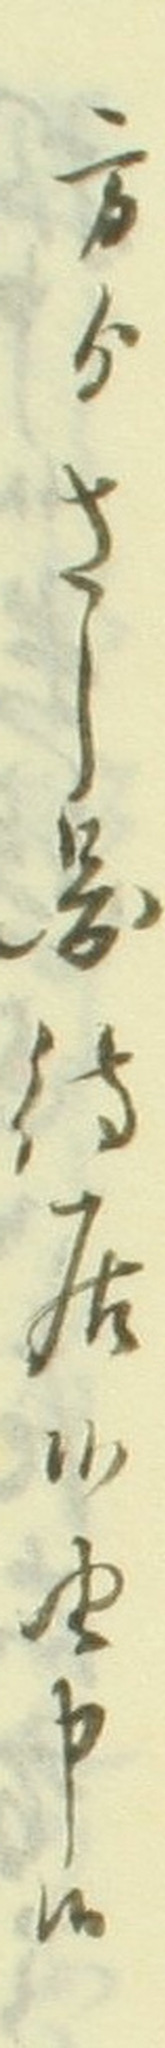方ゟさし図待居候由申候
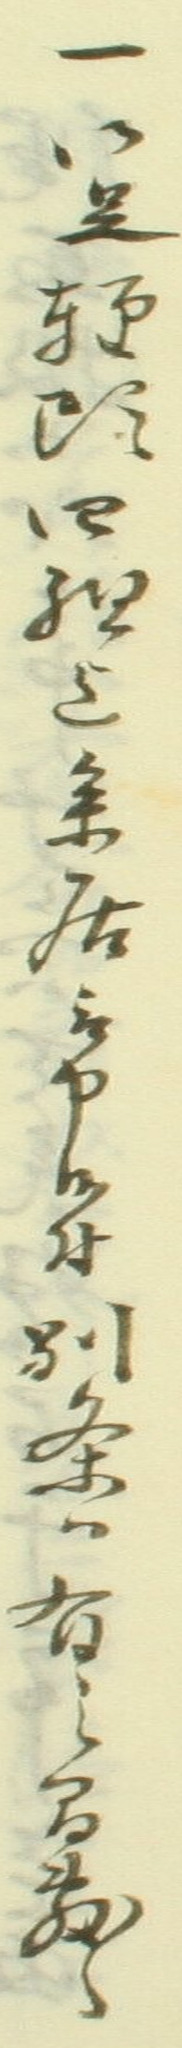一御足軽頭四組迄参居被申候付べ別条は有之間敷候
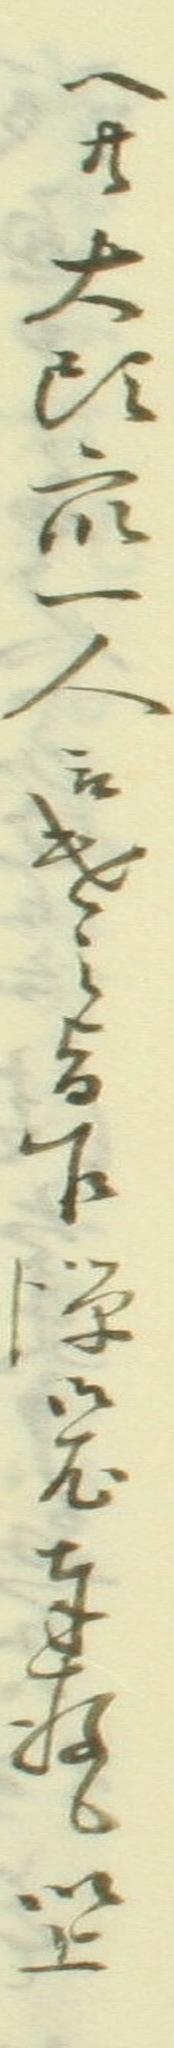へ共大頭衆一人被遣之旨下憚御尤奉存候以上
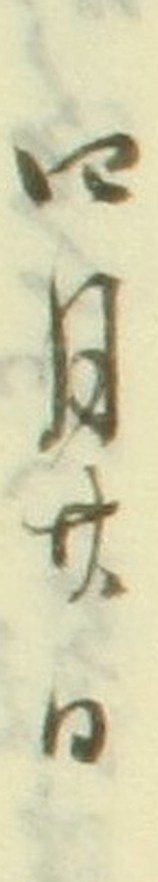四月廿日
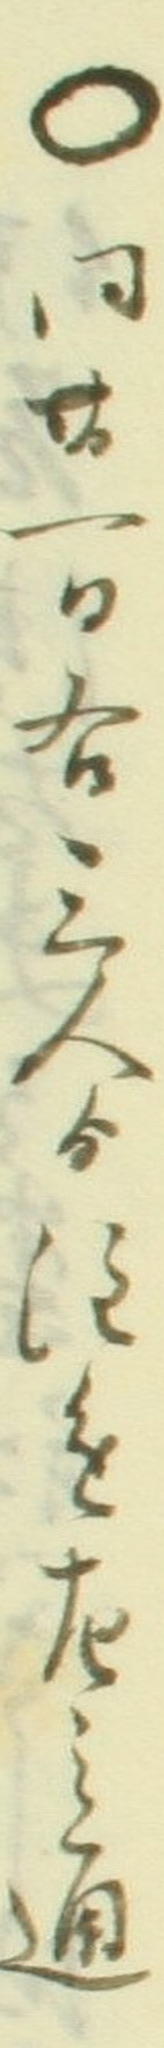〇同廿一日右三人ゟ注進左之通
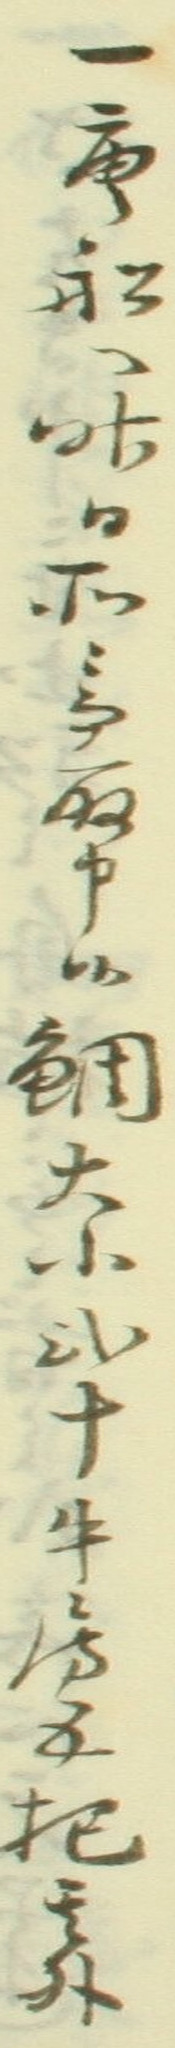一唐船へ昨日所に而取申候鯛大小弐十牛房五把其外
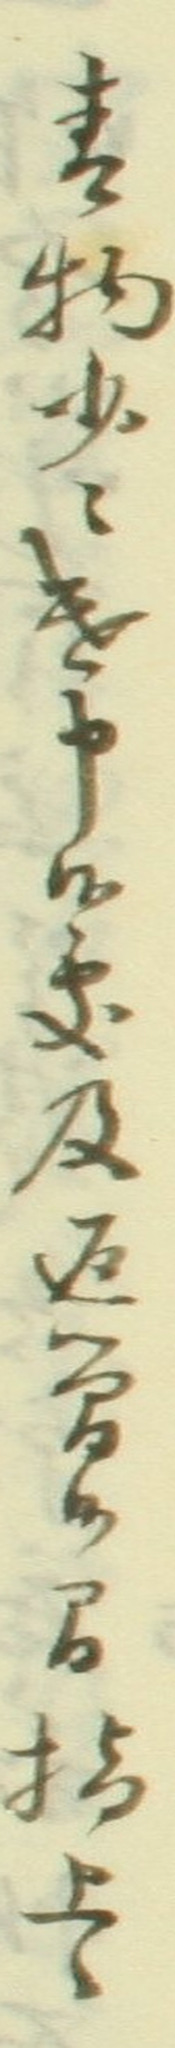青物少々遣申候処及返簡候間指上候

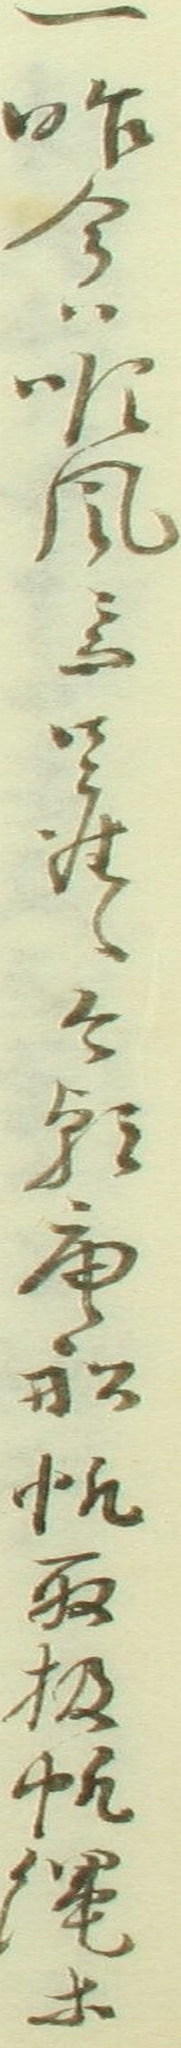一昨今は順風に而御座候今朝唐船帆取扱帆縄等
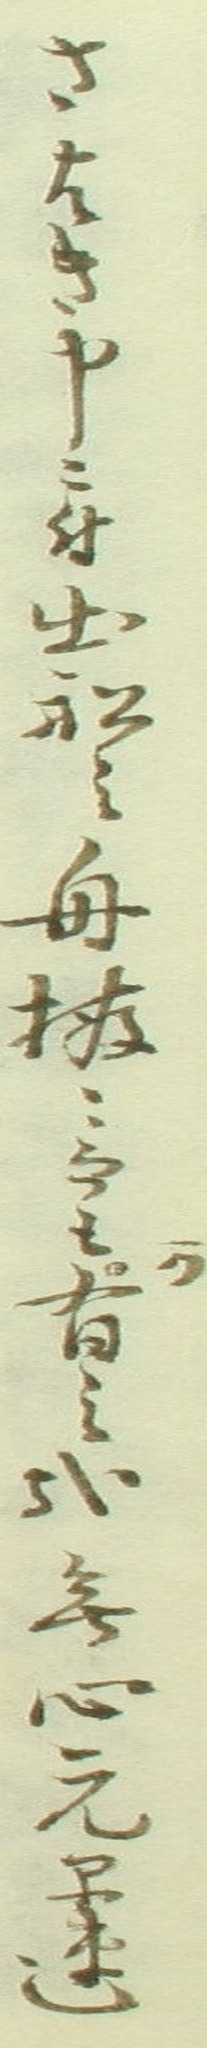さはき申に付出船之舟拵に而も◦有之哉無心元早速
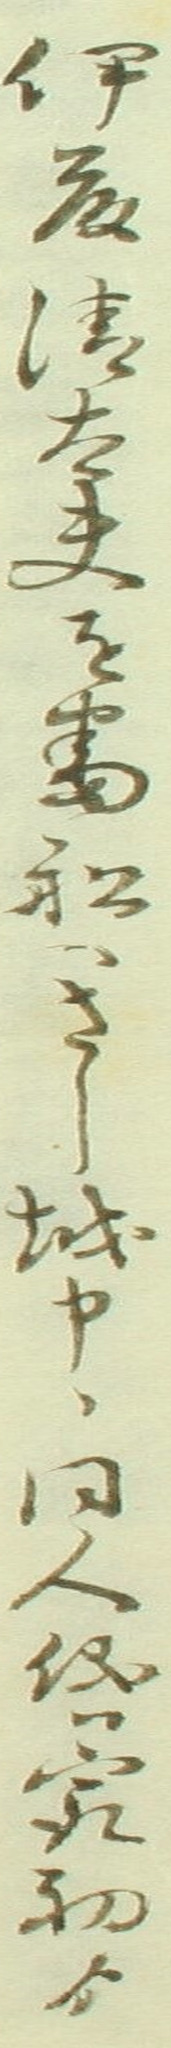伊藤清太夫を番船へさし越申候同人儀は最初ゟ
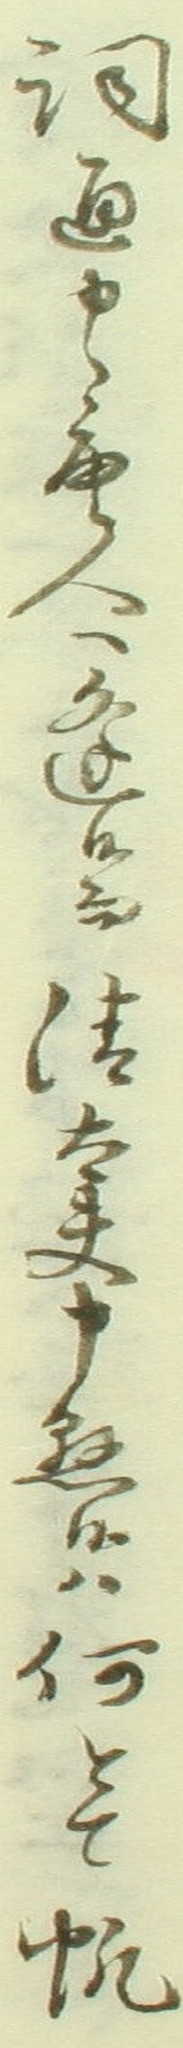詞通申候唐人へ逢候而清太夫申懸候は何とて帆
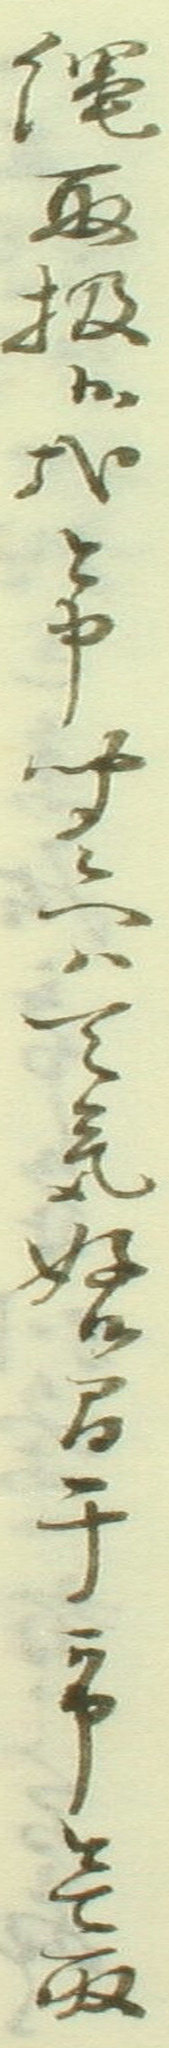縄取扱候哉と申聞候へは天気好候間干可申とて取
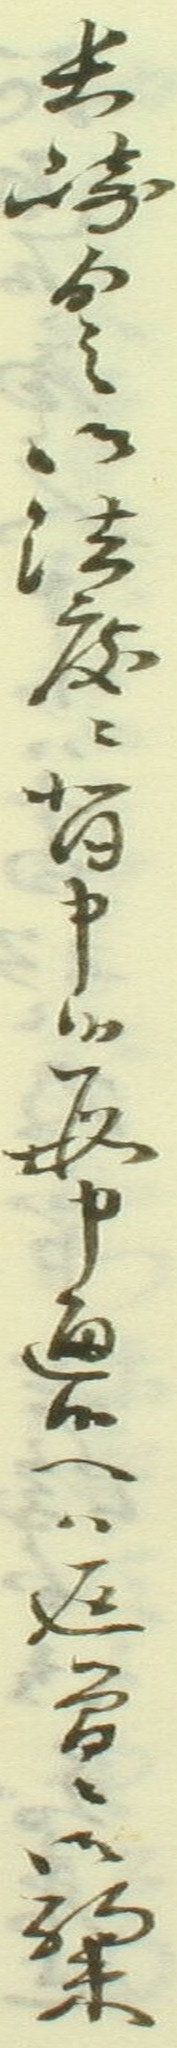長崎ゟ之御法度に背申候段申通候へは返簡に御約束
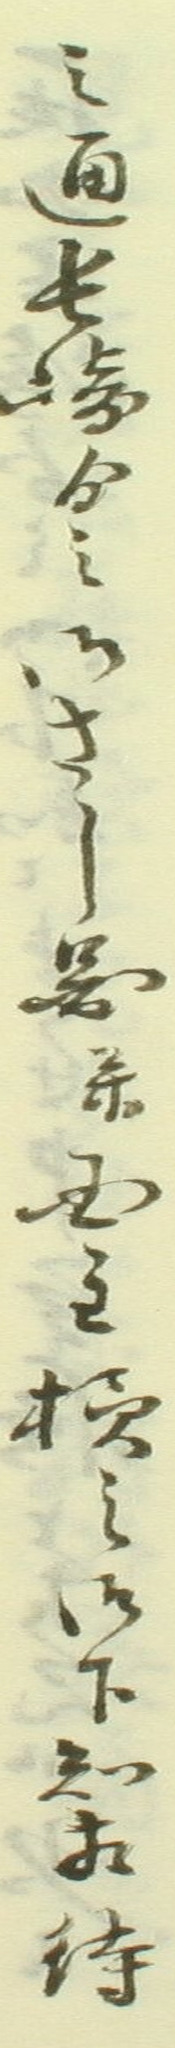之通長崎ゟ之御さし図并国主様之御下知相待
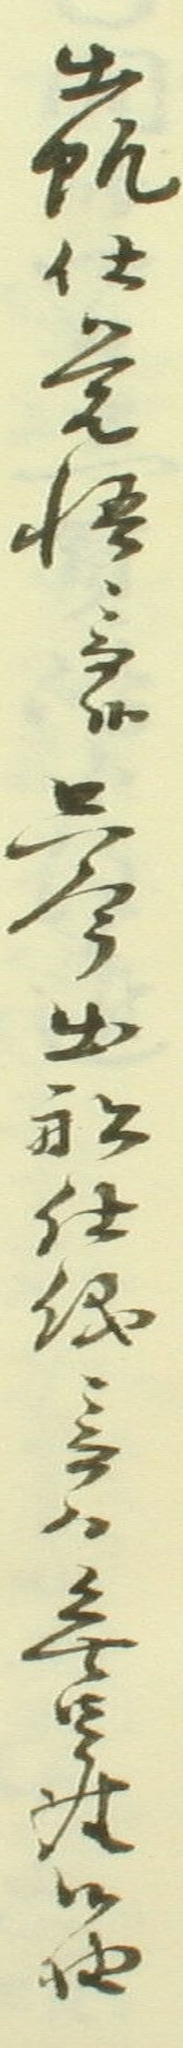出帆仕覚悟に而候只今出船仕儀に而は無御座候由
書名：異国船漂着記
